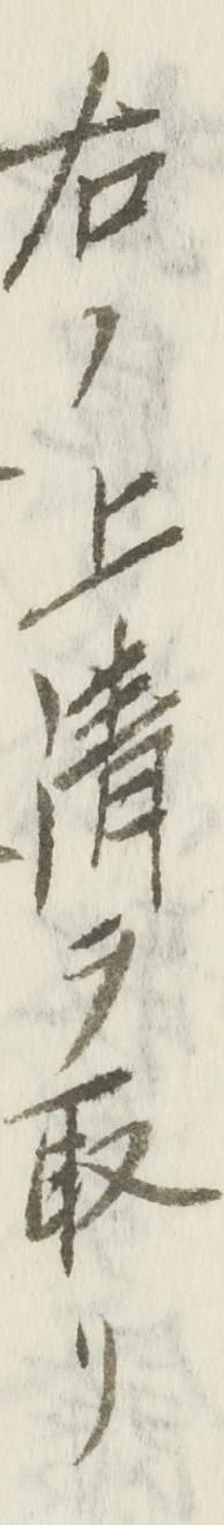右ノ上清ヲ取リ
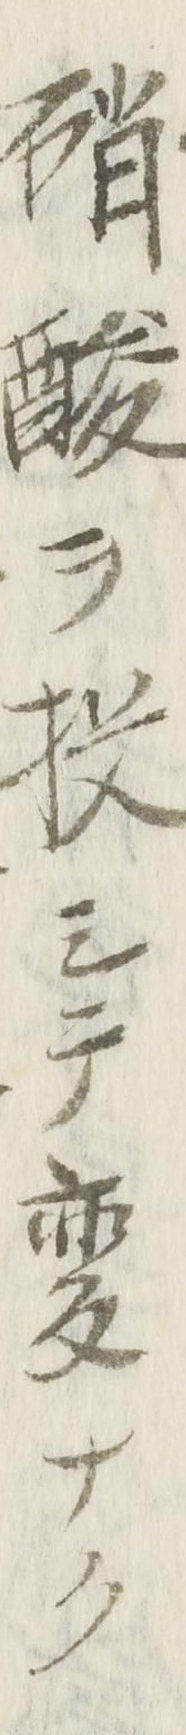硝酸ヲ投ジテ変ナク
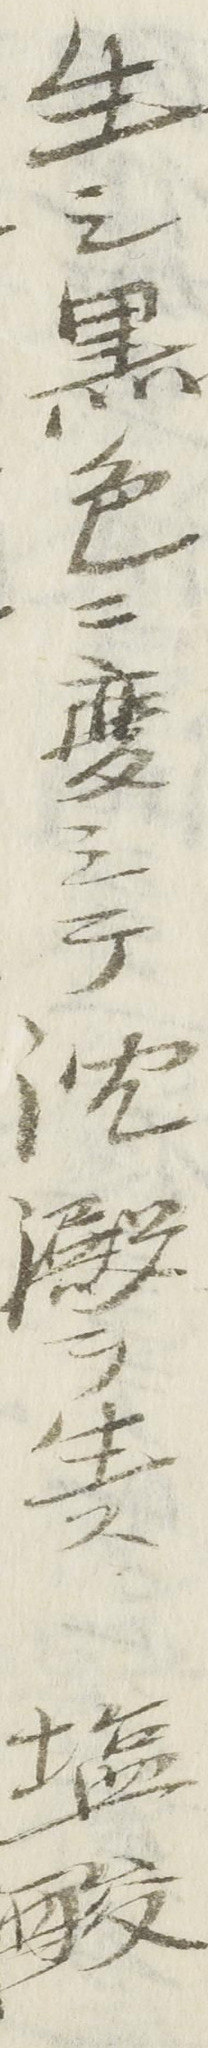生ジ黒色ニ変ジテ沈殿ヲ生ス塩酸
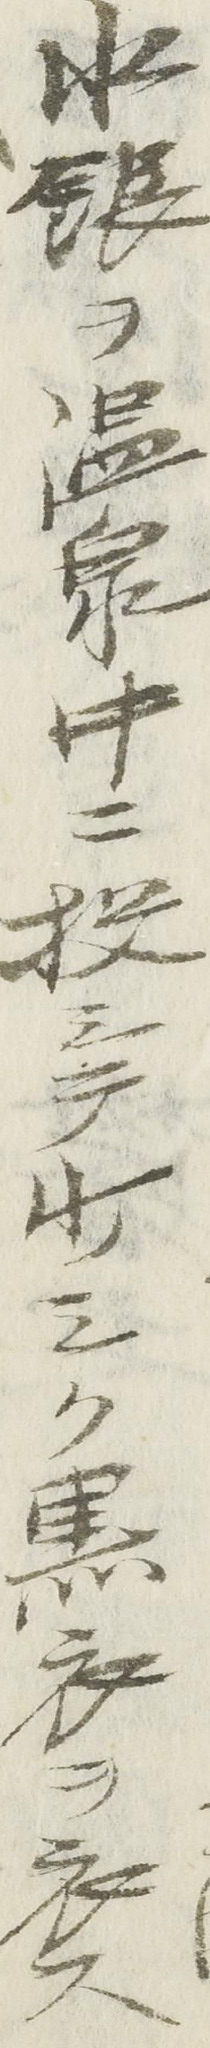水銀ヲ温泉中ニ投ジテ少シク黒衣ヲ衣ス
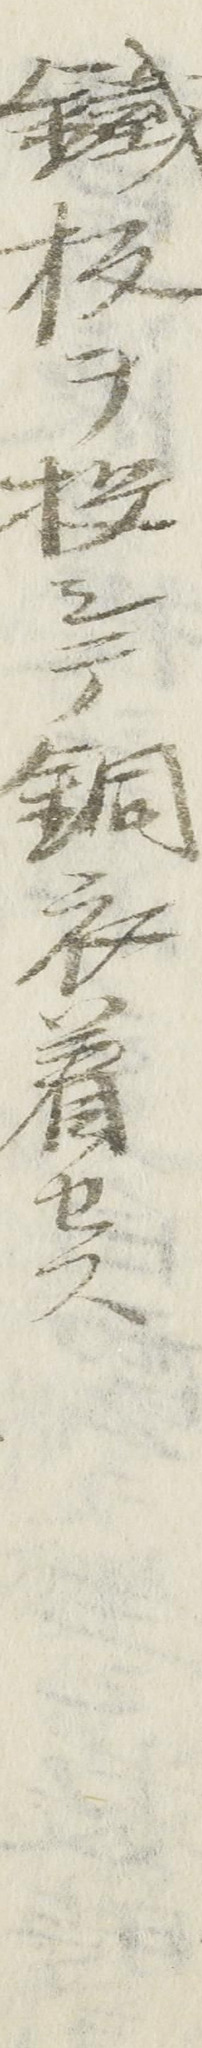鉄板ヲ投ジテ銅衣着セズ
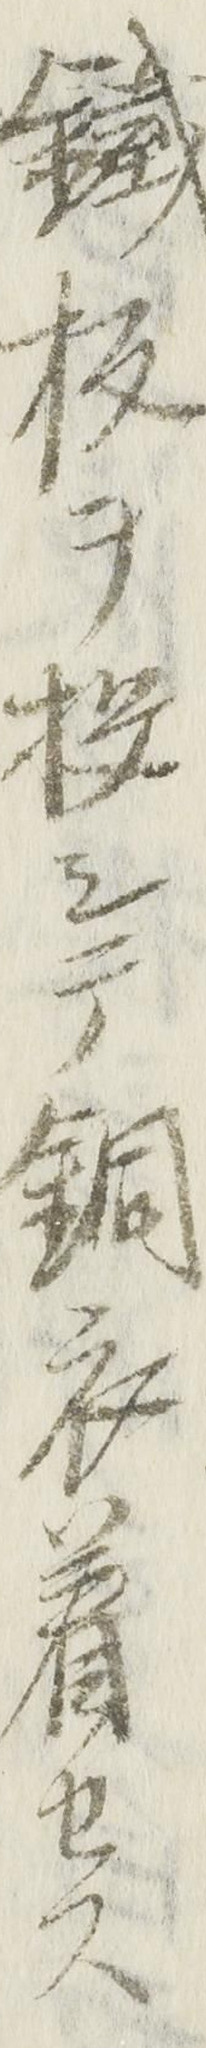鉄板ヲ投ジテ銅衣着セズ
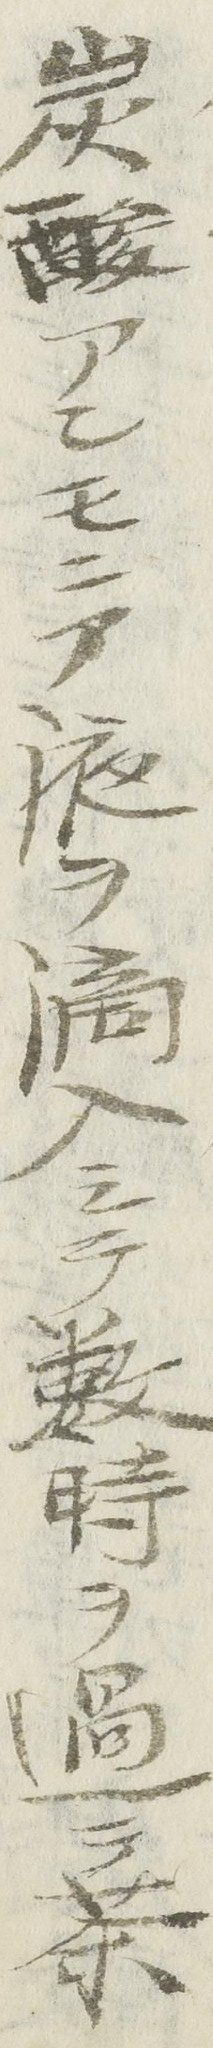炭酸アンモニア液ヲ滴入シテ数時ヲ過テ茶
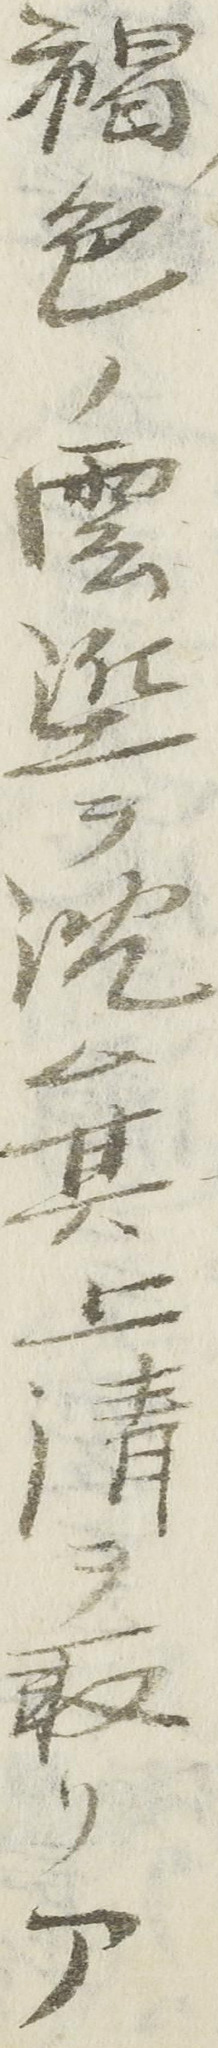褐色ノ雲ヲ沈ム其上清ヲ取リア
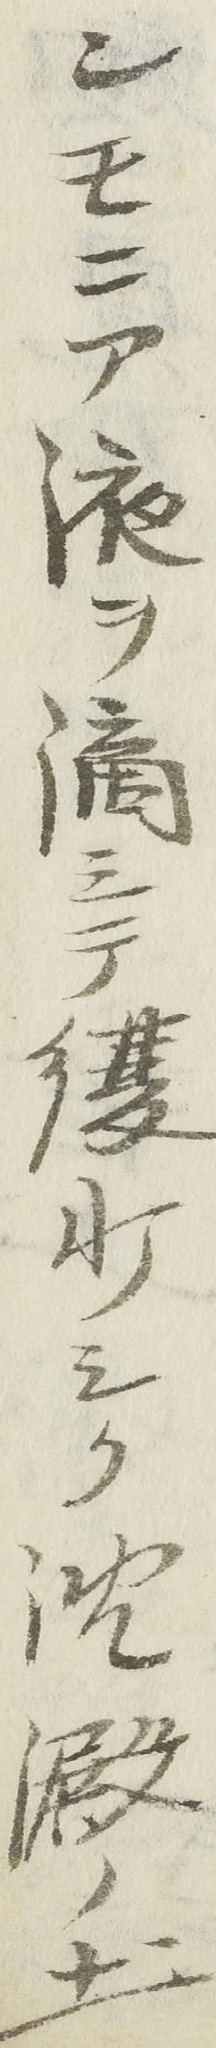ンモ二ア液ヲ滴シテ後少シク沈殿ノ土

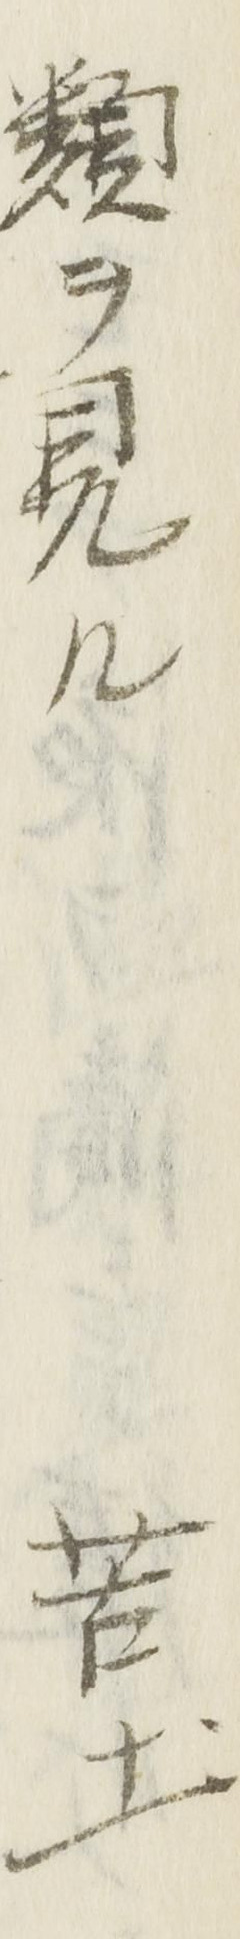類ヲ見ル苦土
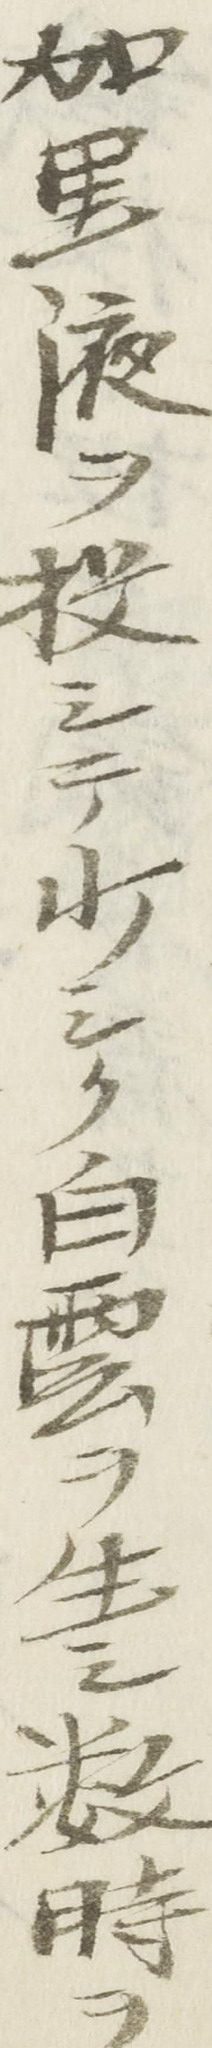加里液ヲ投シテ少シク白雲ヲ生シ数時ヲ
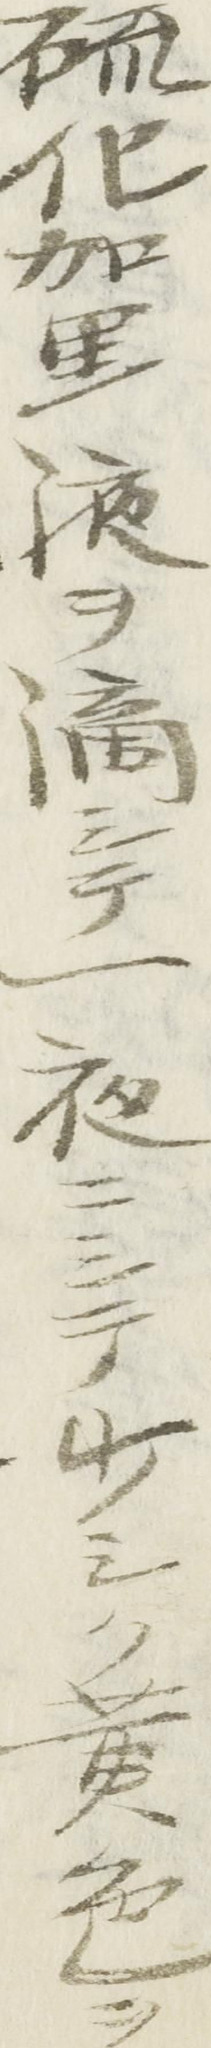硫化加里液ヲ滴シテ一夜ニシテ少シク黄色ヲ
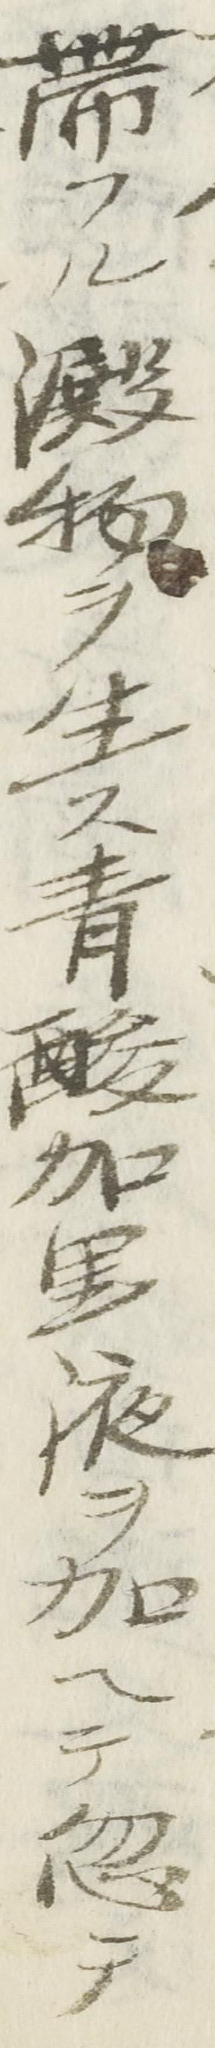帯フル澱物ヲ生ス青酸加里液ヲ加ヘテ忽チ
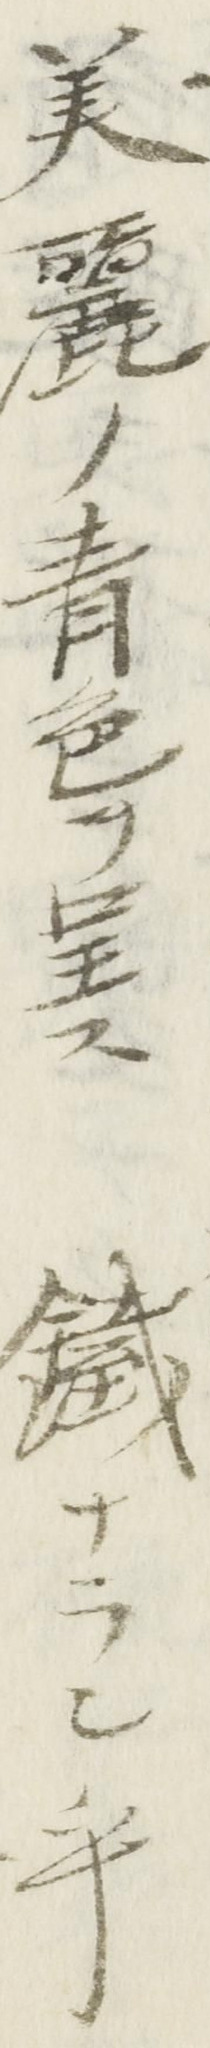美麗ノ青色ヲ呈ス鉄ナラン乎
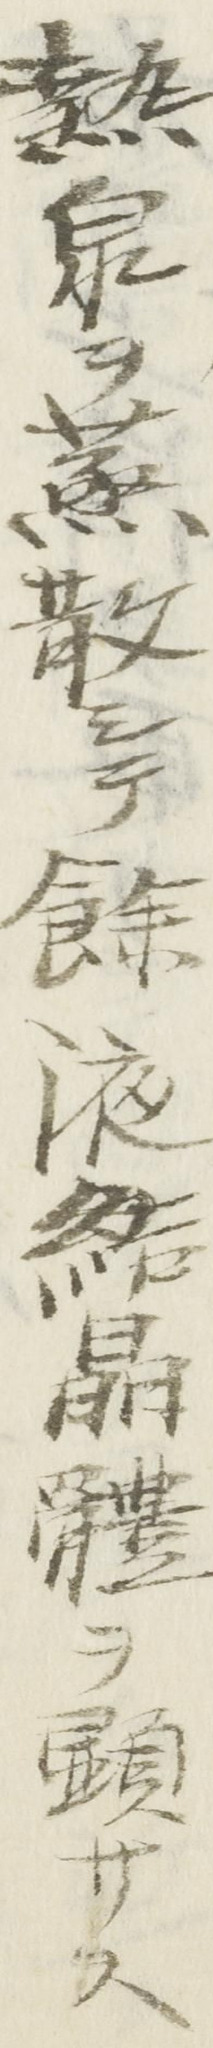熱泉ヲ蒸散シテ餘液結晶体ヲ顕サス
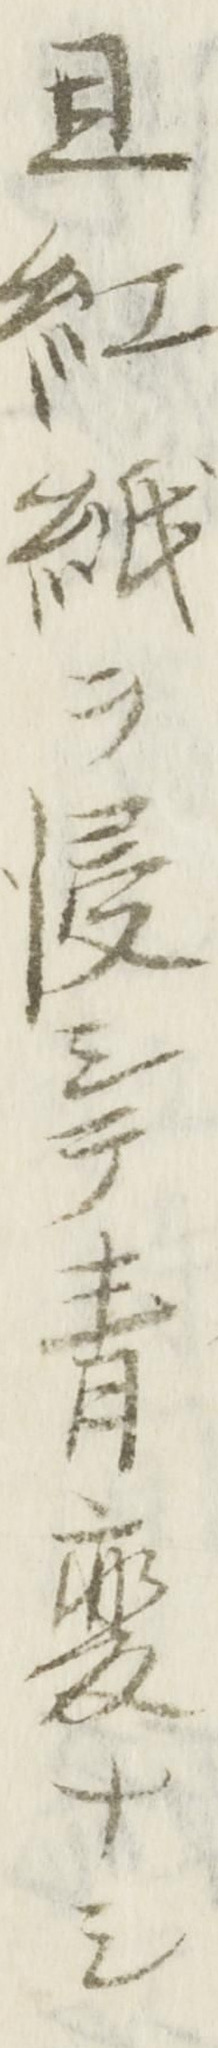且紅紙ヲ浸シテ青変ナシ
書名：温冷泉試験表
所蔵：東京大学地震研究所図書室 Earthquake Research Institute Library, The University of Tokyo, JAPAN
